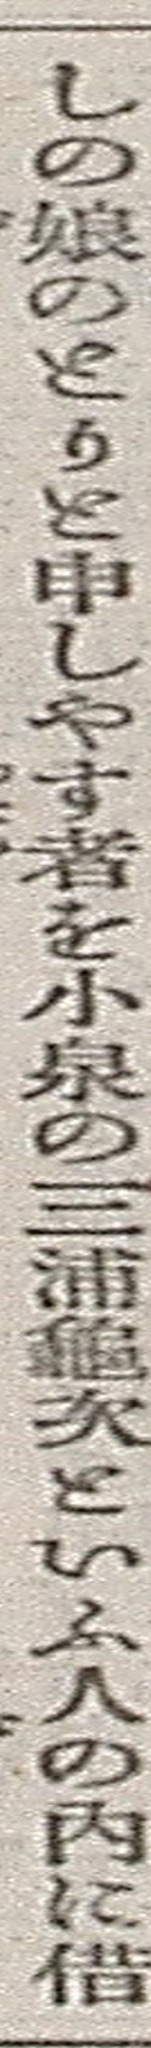しの娘のとりと申しやす者を小泉の三浦亀次といふ人の内に借
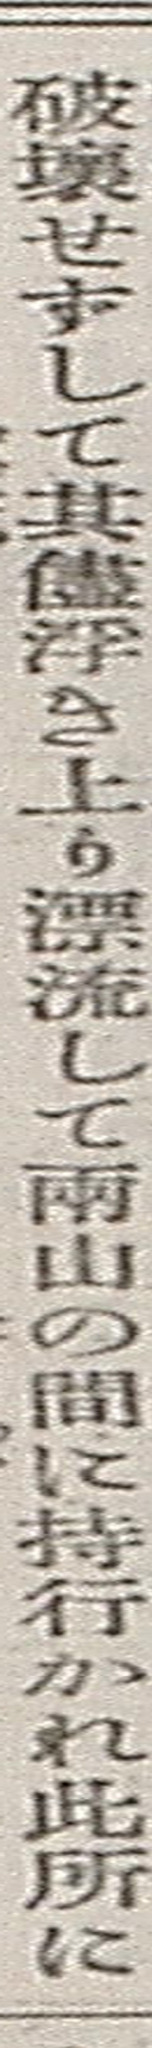破壊せずして其儘浮き上り漂流して両山の間に持行かれ此所に
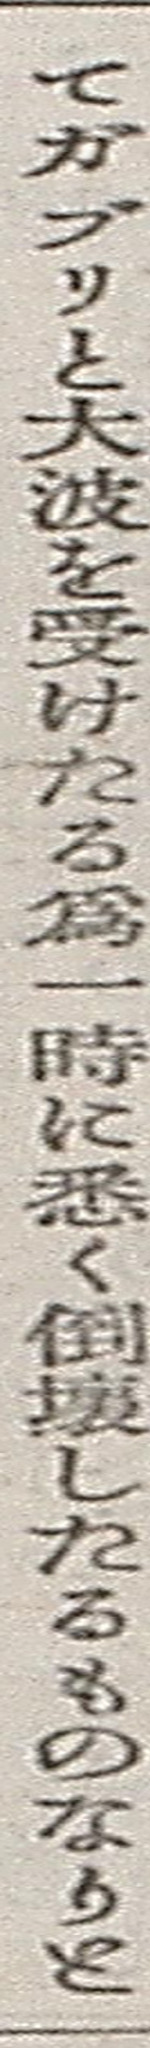てガブリと大波を受けたる為一時に悉く倒壊したるものなりと
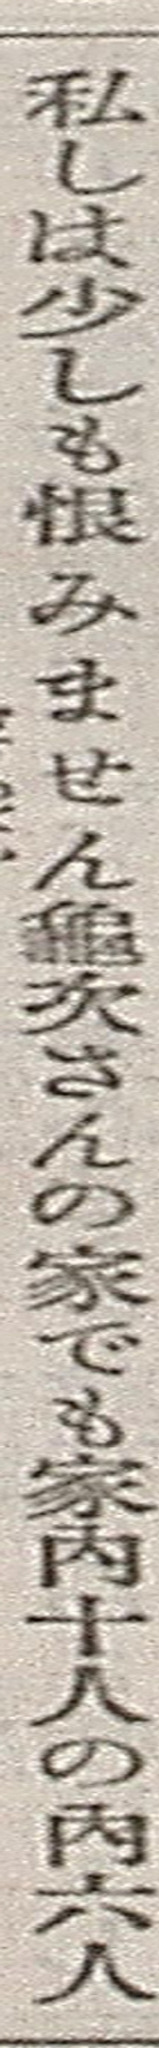私しは少しも恨みません亀次さんの家でも家内十人の内六人
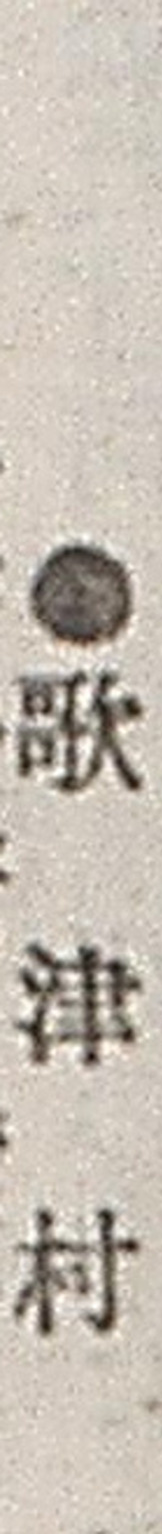●歌津村
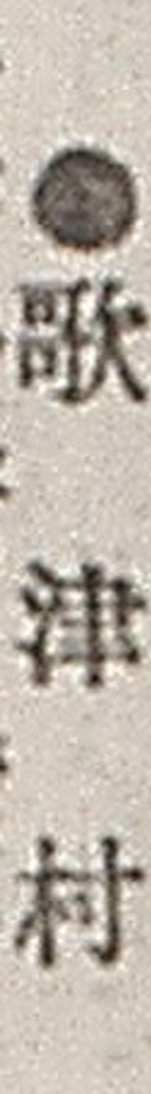●歌津村
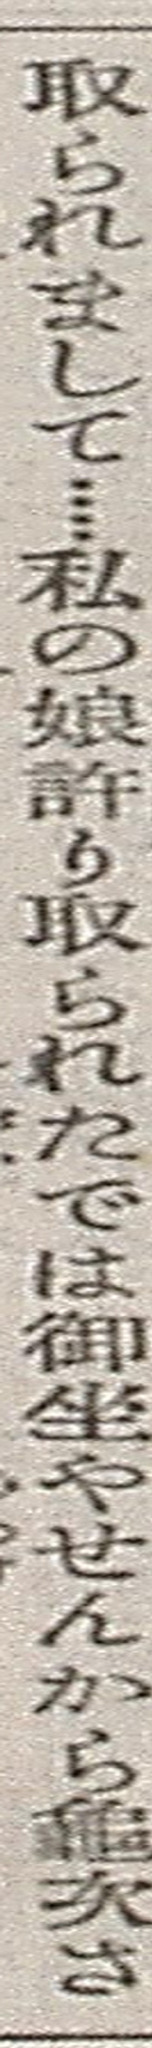取られまして・・・・私の娘許り取られたでは御座やせんから亀次さ
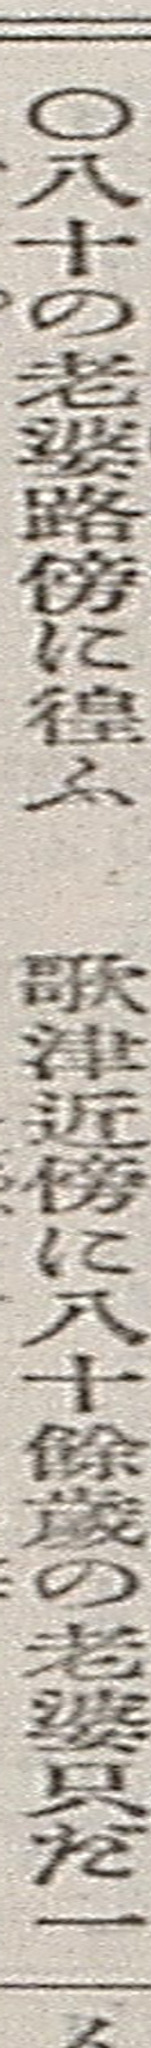〇八十の老婆路傍に徨ふ歌津近傍に八十余歳の老婆只だ一
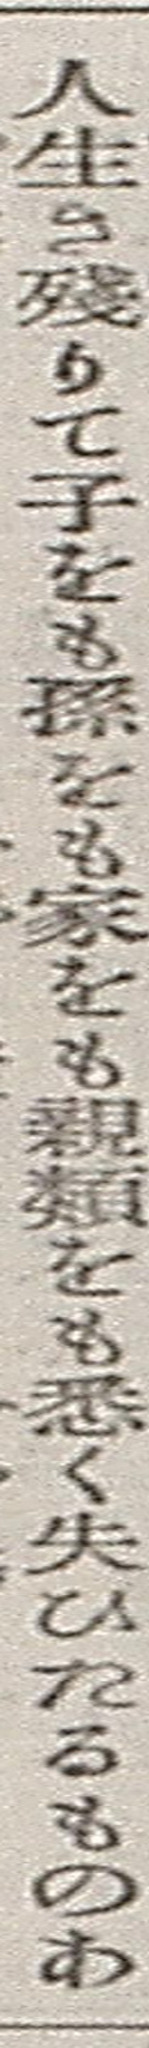人生き残りて子をも孫をも家をも親類をも悉く失ひたるものあ
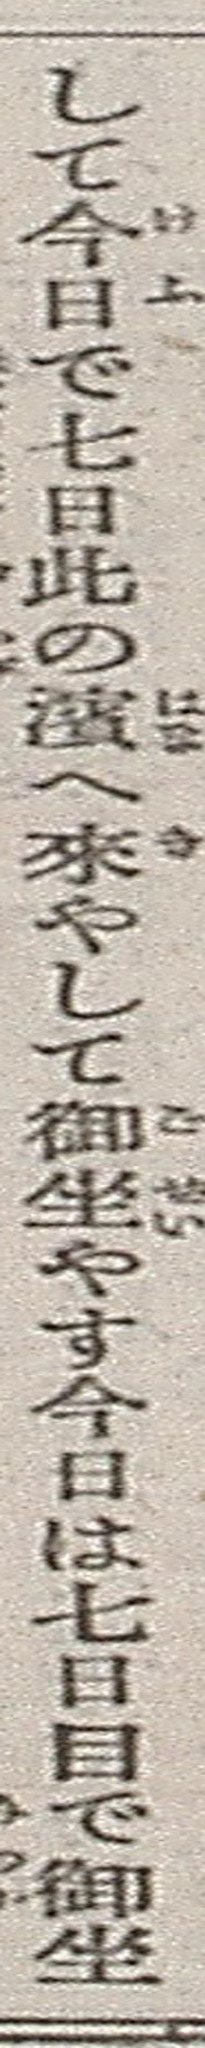して今日で七日此の浜へ来やして御座やす今日は七日目で御座
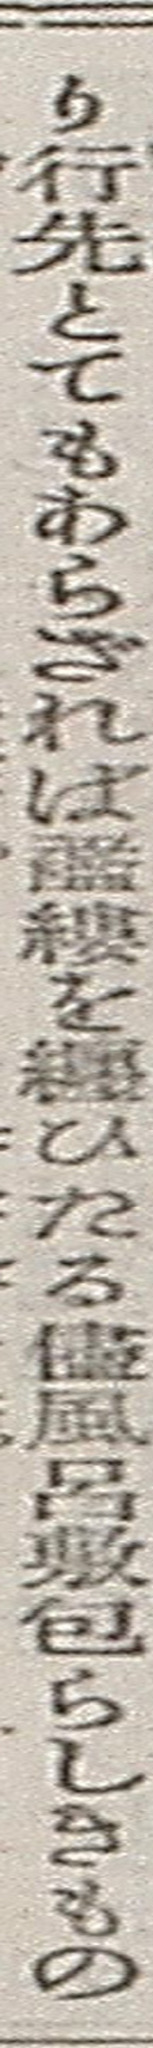り行先とてもあらざれば襤褸を纏ひたる儘風呂敷包らしきもの
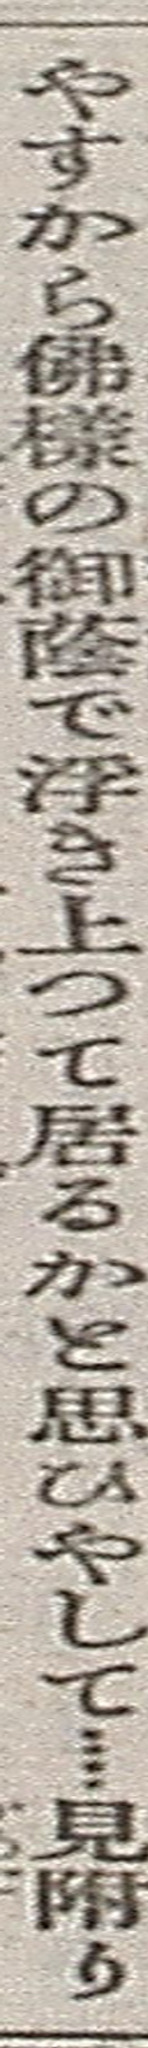やすから仏様の御蔭で浮き上つて居るかと思ひやして・・・・見附り
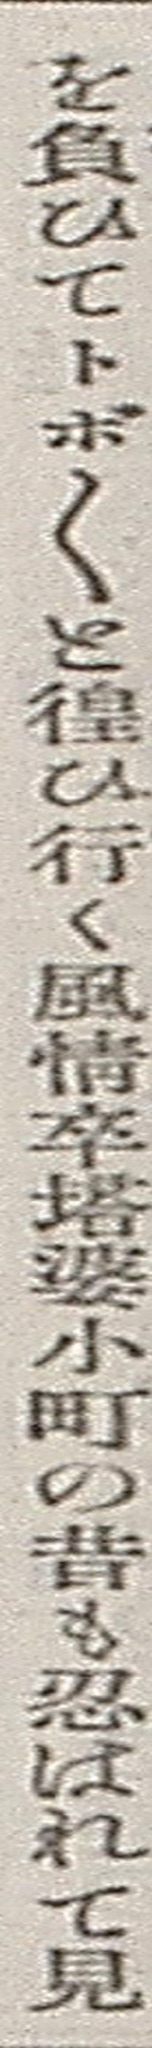を負ひてとボ〳〵と徨ひ行く風情卒塔婆小町の昔も忍はれて見
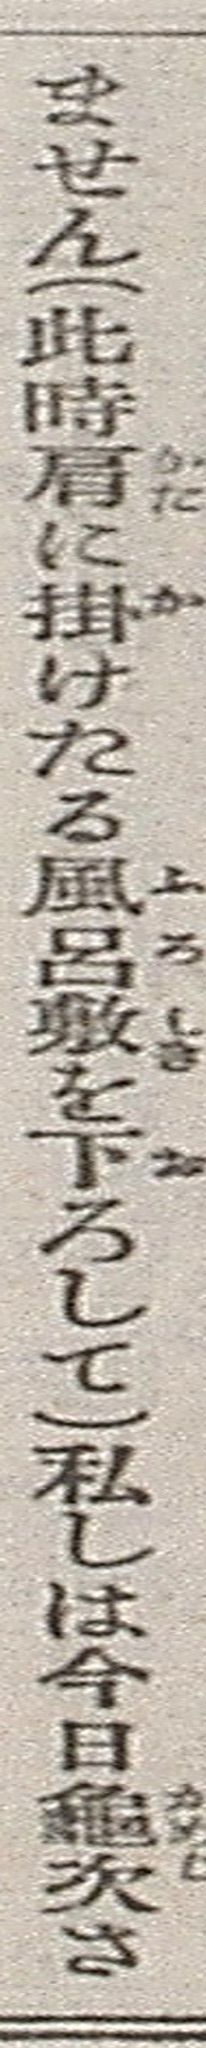ませんに掛けたる風呂敷を下ろして）私しは今日亀次さ

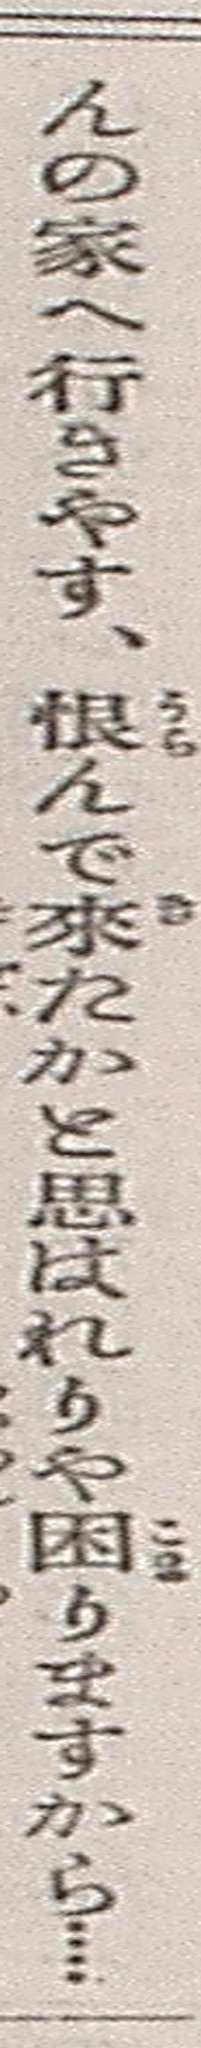んの家へ行きやす、恨んで来たかと思はれりや困りますから・・・・
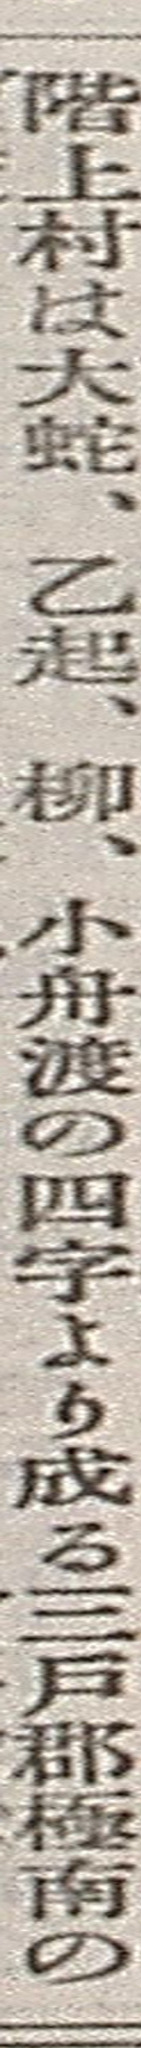階上村は大蛇、乙越、柳、小舟渡の四字より成る三戸郡極南の
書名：風俗畫報臨時増刊第百十九號　大海嘯被害録（中）
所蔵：東京大学地震研究所図書室 Earthquake Research Institute Library, The University of Tokyo, JAPAN
